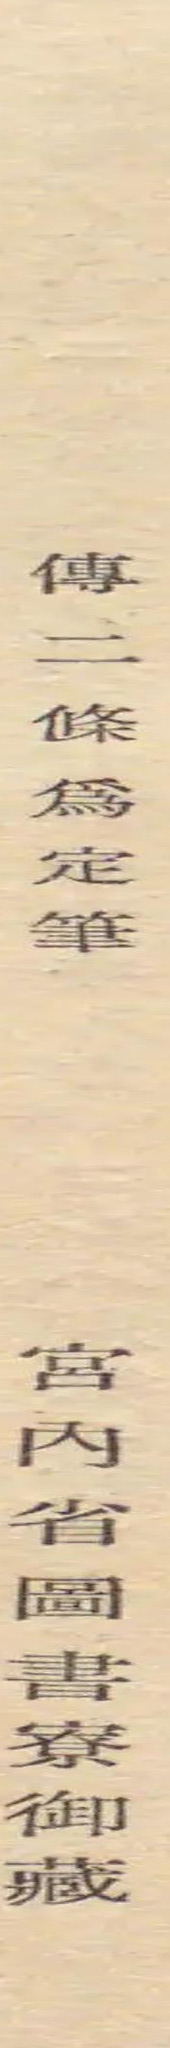図伝二条為定筆宮内省図書寮御蔵
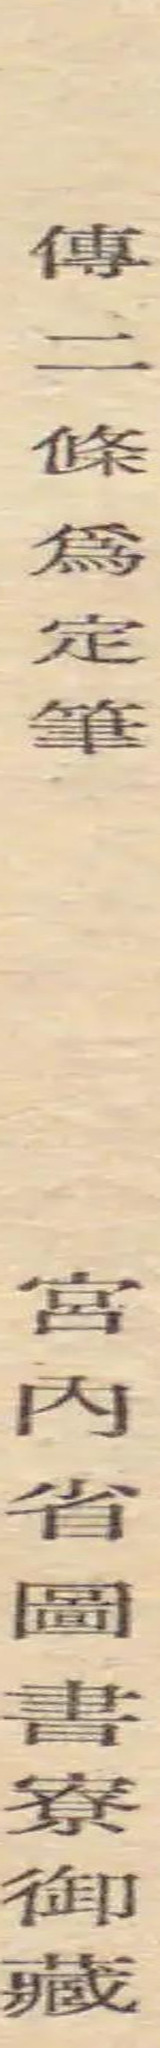図伝二条為定筆宮内省図書寮御蔵
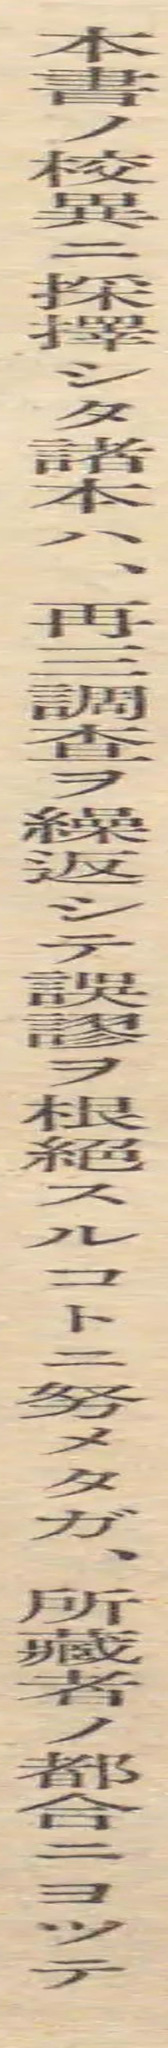本書ノ校異ニ採択シタ諸本ハ、再三調査ヲ繰返シテ誤謬ヲ根絶スルコトニ努メタガ、所蔵者ノ都合ニヨツテ
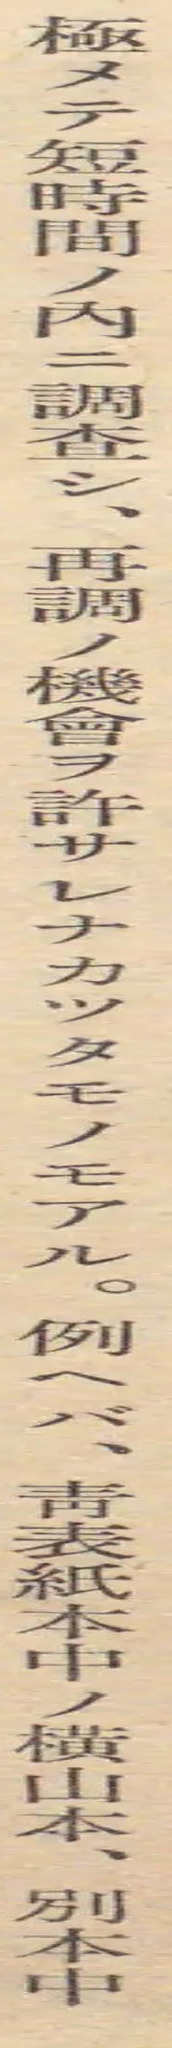極メテ短時間ノ内ニ調査シ、再調ノ機会ヲ許サレナカツタモノモアル。例ヘバ、青表紙本中ノ横山本、別本中
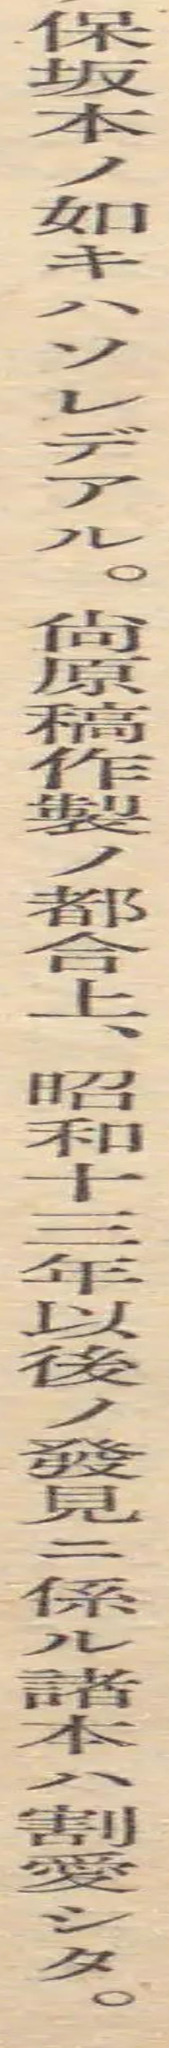ノ保坂本ノ如キハソレデアル。尚原稿作製ノ都合上、昭和十三年以後ノ発見ニ係ル諸本ハ割愛シタ。
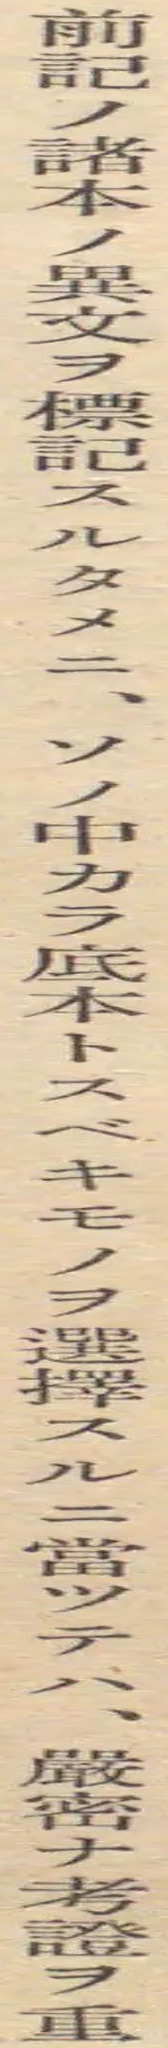前記ノ諸本ノ異文ヲ標記スルタメニ、ソノ中カラ底本トスベキモノヲ選択スルニ当ツテハ、厳密ナ考証ヲ重
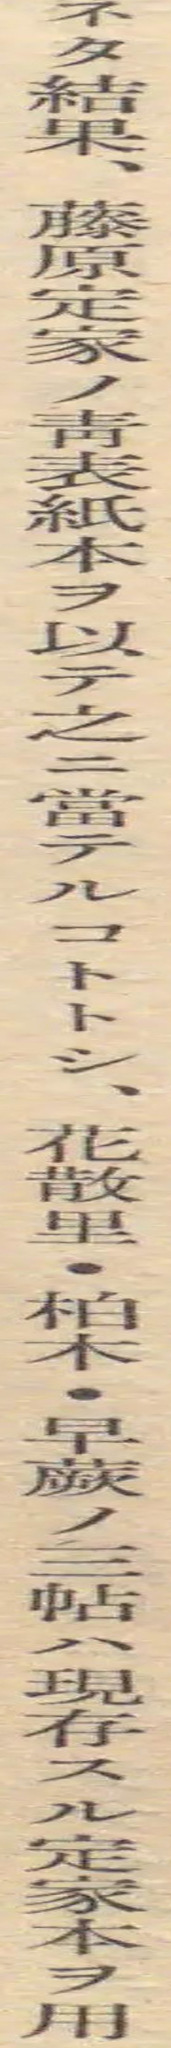ネタ結果、藤原定家ノ青表紙本ヲ以テ之ニ当テルコトトシ、花散里・柏木・早蕨ノ三帖ハ現存スル定家本ヲ用
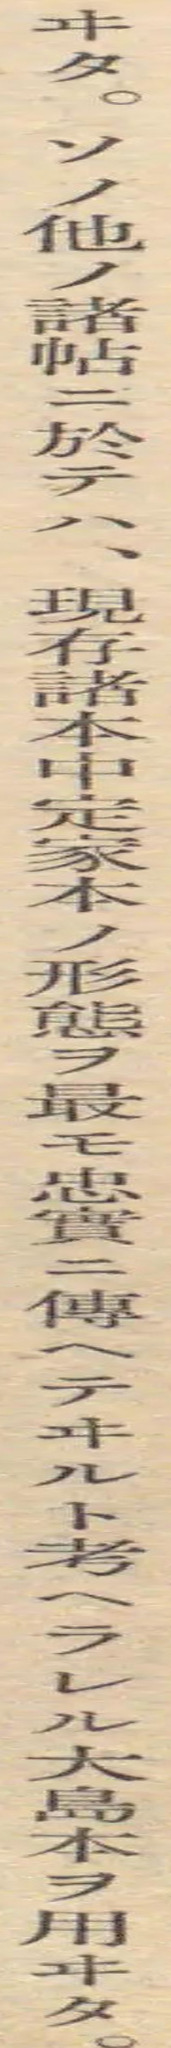ヰタ。ソノ他ノ諸帖ニ於テハ、現存諸本中定家本ノ形態ヲ最モ忠実ニ伝ヘテヰルト考ヘラレル大島本ヲ用ヰタ。
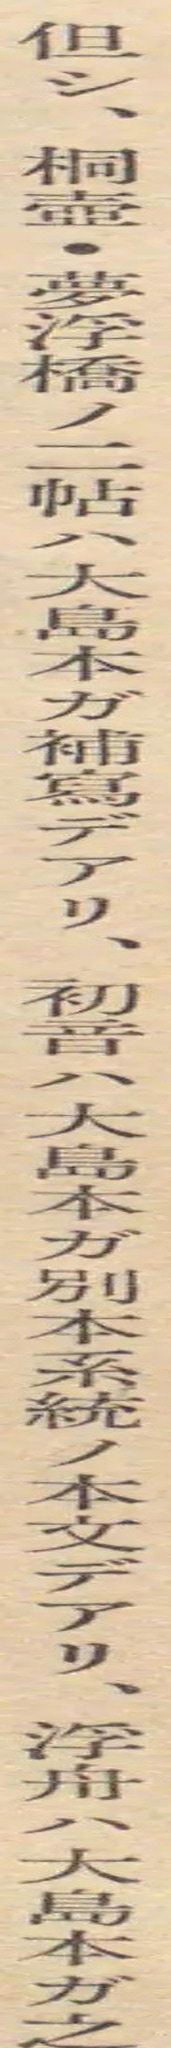但シ、桐壺・夢浮橋ノ二帖ハ大島本ガ補写デアリ、初音ハ大島本ガ別本系統ノ本文デアリ、浮舟ハ大島本ガ之
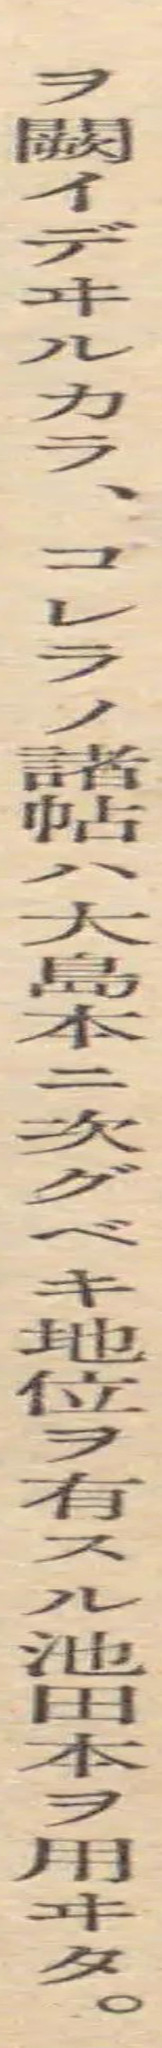ヲ闕イデヰルカラ、コレラノ諸帖ハ大島本ニ次グベキ地位ヲ有スル池田本ヲ用ヰタ。

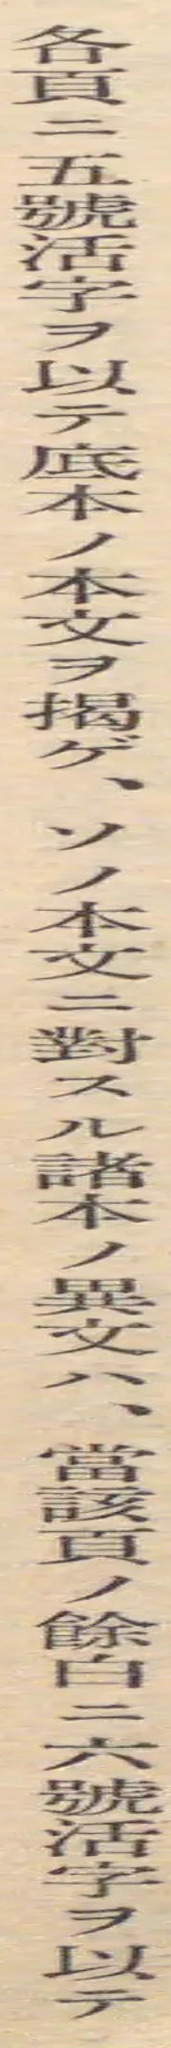各頁ニ五号活字ヲ以テ底本ノ本文ヲ掲ゲ、ソノ本文ニ対スル諸本ノ異文ハ、当該頁ノ余白ニ六号活字ヲ以テ
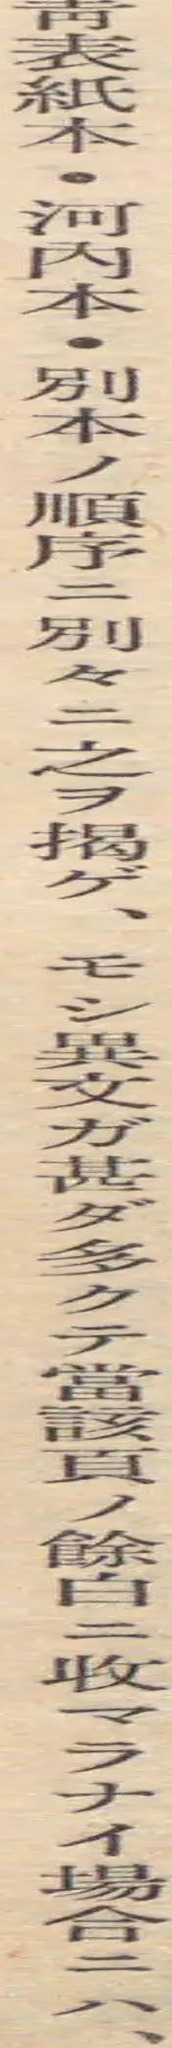青表紙本・河内本･別本ノ順序ニ別々ニ之ヲ掲ゲ、モシ異文ガ甚ダ多クテ当該頁ノ余白ニ収マラナイ場合ニハ、
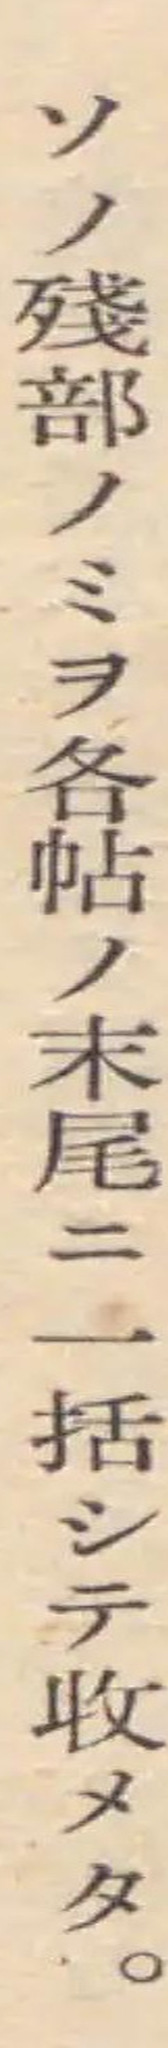ソノ残部ノミヲ各帖ノ末尾ニ一括シテ収メタ。
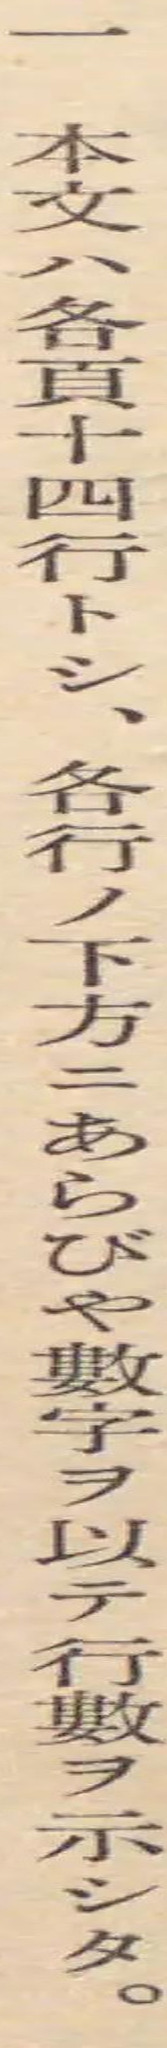一本文ハ各頁十四行トシ、各行ノ下方ニあらびや数字ヲ以テ行数ヲ示シタ。
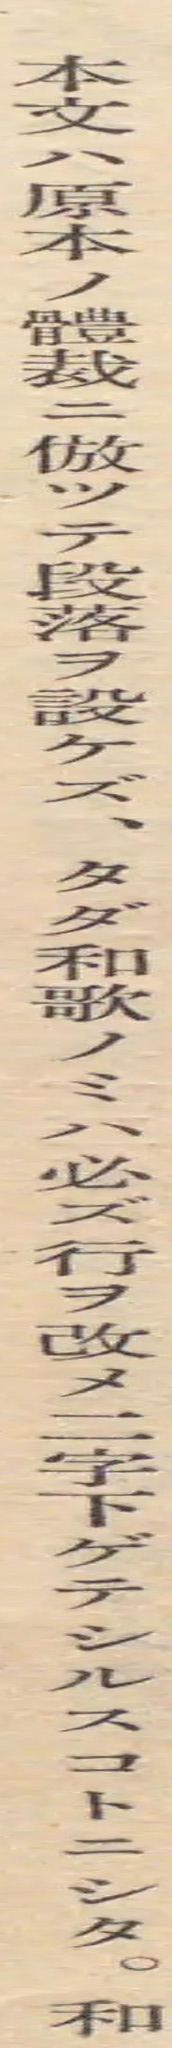一本分ハ原本ノ体裁ニ倣ツテ段落ヲ設ケズ、タダ和歌ノミハ必ズ行ヲ改メ二字下ゲテシルスコトニシタ。和
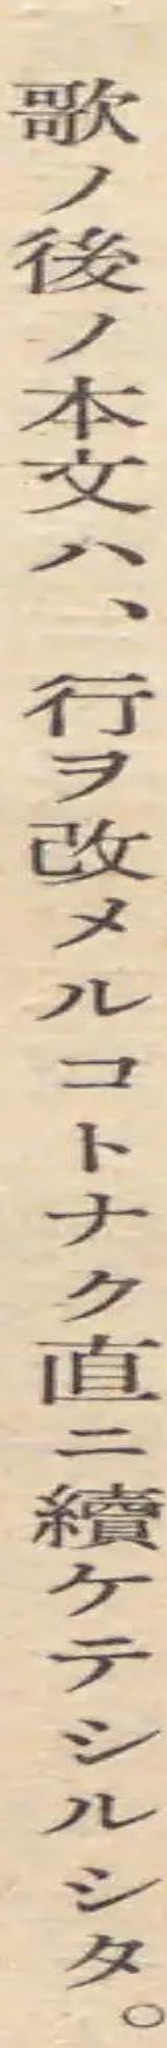歌ノ後本文ハ、行ヲアラタメルコトナク直ニ続ケテシルシタ。
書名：校異源氏物語.
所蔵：国立国会図書館 National Diet Library, JAPAN
